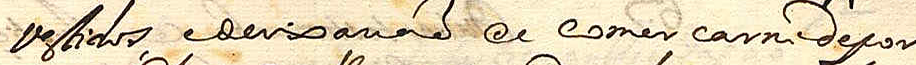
vestidos, e deixauaõ de comer carne de por
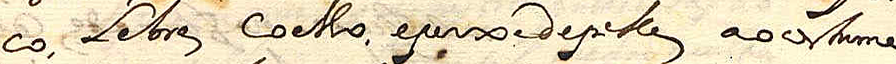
co, Lebre coelho, e peixe de pelle ao costume
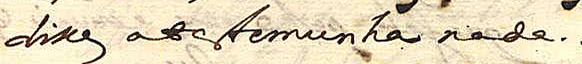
disse a testemunha nada.
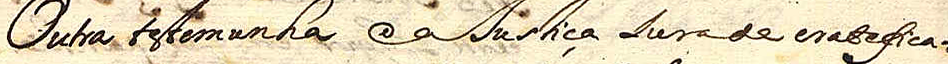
Outra testemunha da Iustiça iurada e ratefica
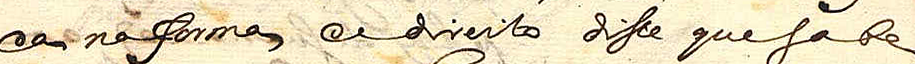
da na forma de direito disse que sabe
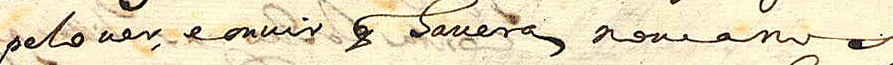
pelo uer, e ouuir q̄ hauera noue anos
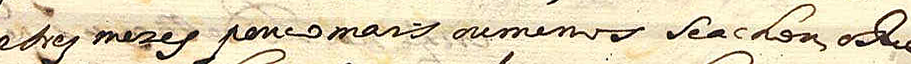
e trez mezes pouco mais ou menos se achou o Reo
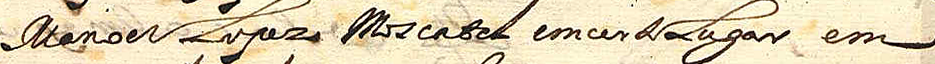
Manoel Lopez Moscatel em certo Lugar em
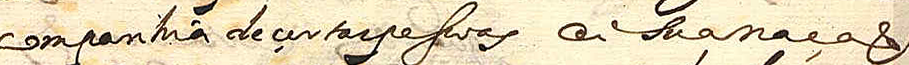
companhia de çertas pessoas de sua naçaõ
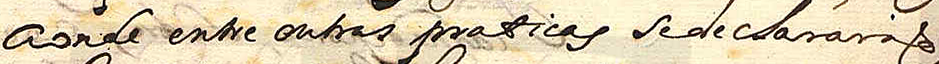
aonde entre entre outras praticas se declararaõ
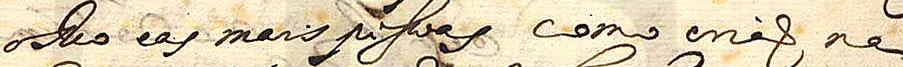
o Reo e as mais pessoas como criaõ na
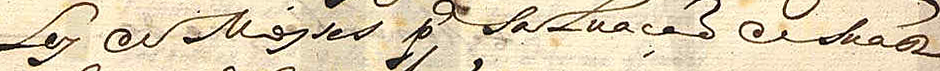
Ley de Mojses pa Saluaçaõ de Suas
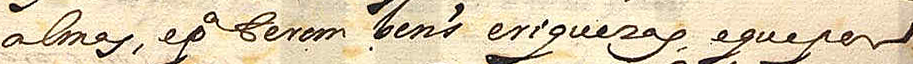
almas, e pa terem bens̄ e riquezas,e que por
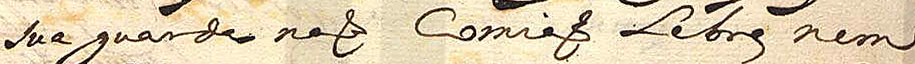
sua guarda naõ Comiaõ Lebre nem
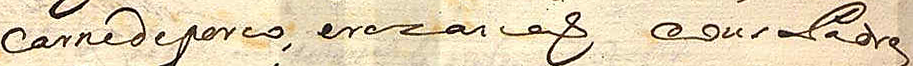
carne de porco, e rezauaõ dous Padre
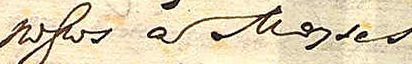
nossos a Moyses
